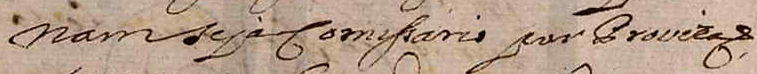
nam seja Comissario por Provizaõ,
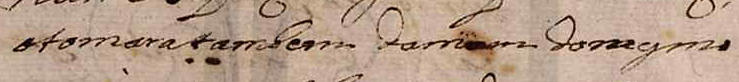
o tomara tambem da mam do mesmo
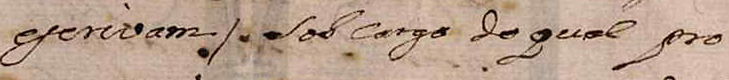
escrivam / sob cargo do qual pro
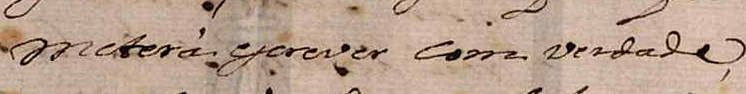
meterá escrever com verdade
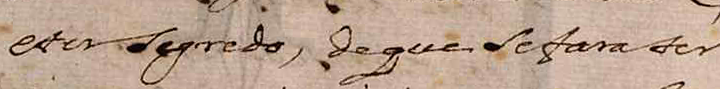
e ter segredo, de que se fara ter
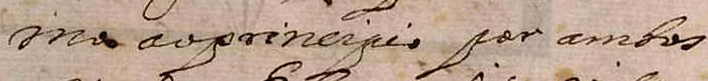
mo ao principio por ambos
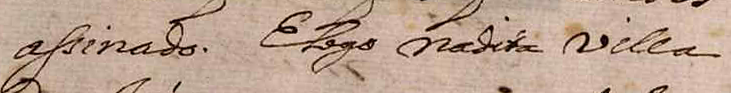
assinado. E logo na dita villa
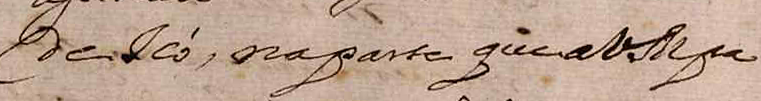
de Icó, na parte que a VM pa
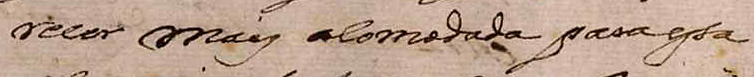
recer mais acomodada para esta
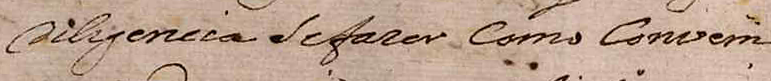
diligencia se fazer como convem
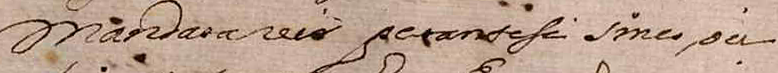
mandara vir perante si sinco, ou
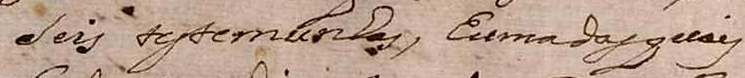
seis testemunhas, huma das quaes
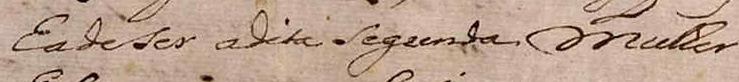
ha de ser a dita segunda mulher
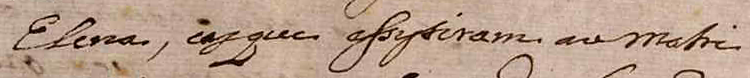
Elena, e as que assistiram ao matri
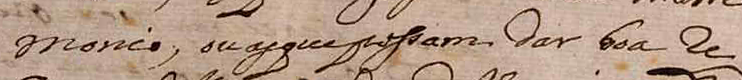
monio, ou as que possam dar boa Re
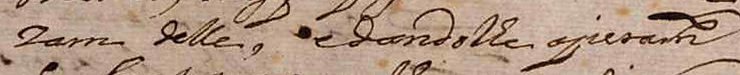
zam delle, e dandolhe o juramto
